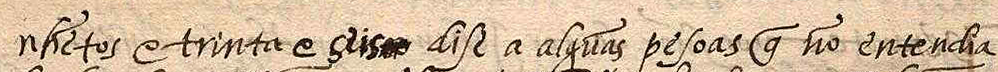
nhētos e trinta e seis dise a algūas pesoas q̄ nō entendia
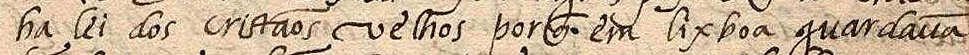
ha lei dos cristãos velhos porq̄ em lixboa guardauā
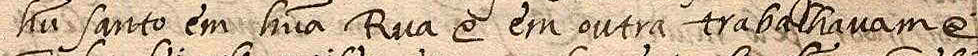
hū santo em hūa Rua e em outra trabalhauam e
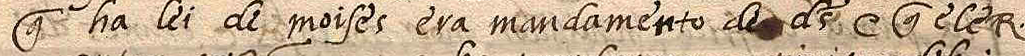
q̄ ha lei de moises era mandamento de ds̄ e q̄ ele R.
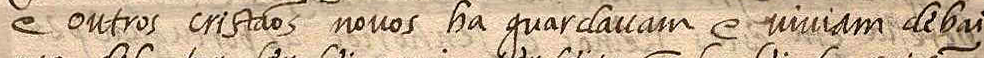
e outros cristãos nouos ha guardauam e uiuiam debai
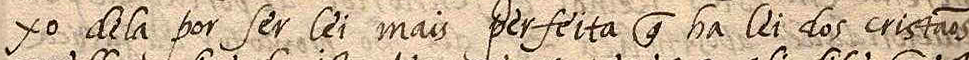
xo dela por ser lei mais perfeita q̄ ha lei dos cristãos
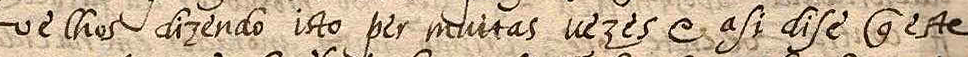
velhos dizendo isto per muitas uezes e asi dise q̄ este
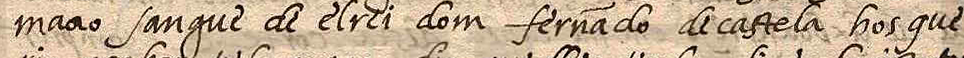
maao sangue de el rei dom fernādo de castela hos que
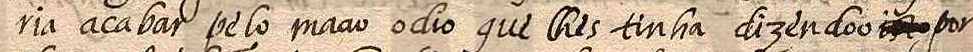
ria acabar pelo maao odio que lhes tinha dizendoo isto por
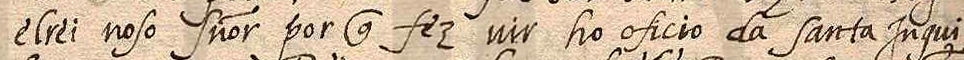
el rei noso snōr porq̄ fez uir ho oficio da santa Jnqui
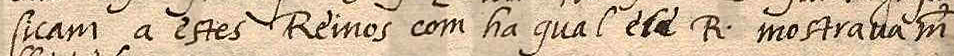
siçam a estes Reinos com ha qual ele R. mostraua mto
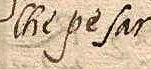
lhe pesar
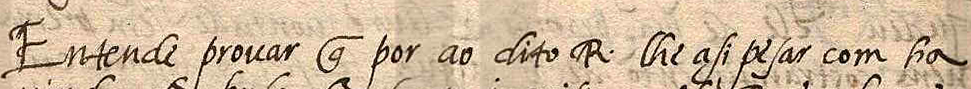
Entende prouar q̄ por ao dito R. lhe asi pesar com ha
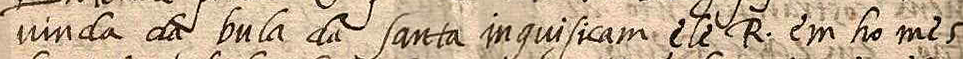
uinda da bula da santa inquisiçam ele R. em ho mes
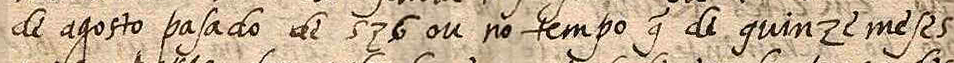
de agosto pasado de 536 ou no tempo q̄ de quinze meses
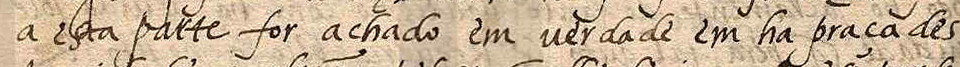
a esta parte for achado em uerdade em ha praça des
